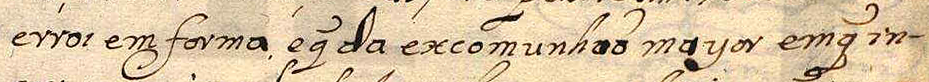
erros em forma, e q̄ da excomunhaõ mayor em q̄ in
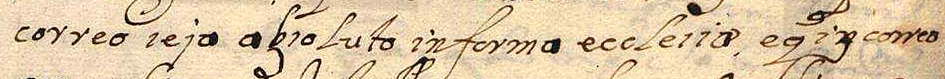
correo seja absoluto in forma ecclesiæ, e q̄ incorreo
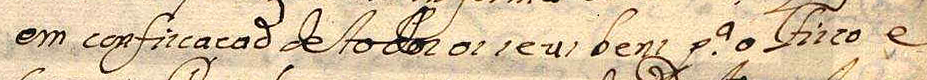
em confiscaçaõ de todos os seus bens p.a o Fisco e
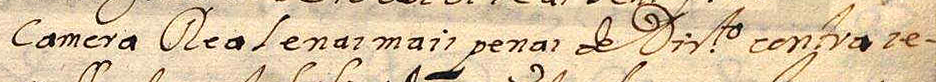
Camera Real e nas mais penas de Dir.to contra se
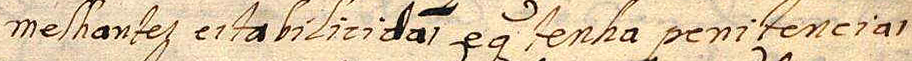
melhantes estabilicidas e q̄ tenha penitencias
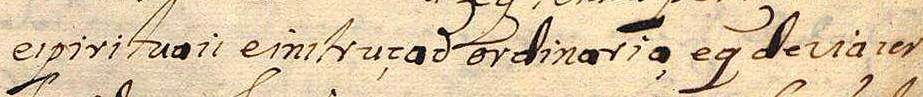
espirituais, e instruçaõ ordinaria, e q̄ dezia ser
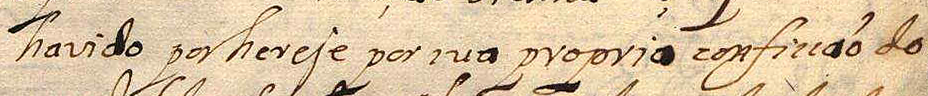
havido por hereje por sua propria confissaõ do
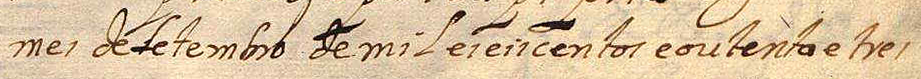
mes de Setembro de mil e seiscentos e outenta e tres
